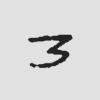乃
